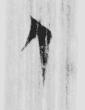人
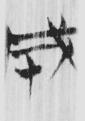成
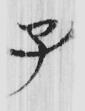子
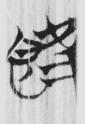既
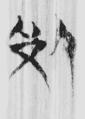死
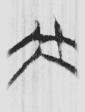太
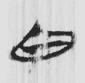白
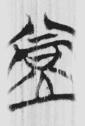當
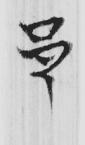邑
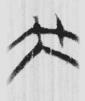太
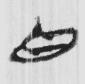白
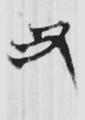又
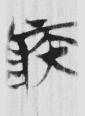疾
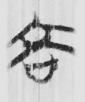吝
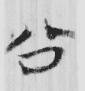公
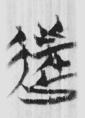{辶之𡈼}
